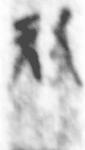君
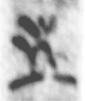之
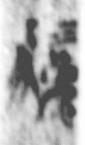○（驒）
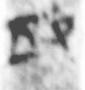攻
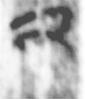尹
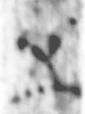之
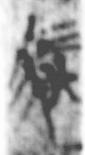駟
